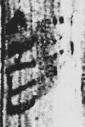○（聞）
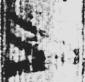之
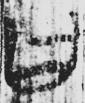曰
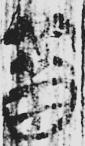昔
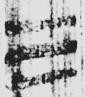三
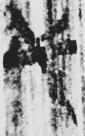弋（代）
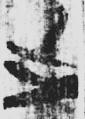之
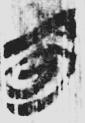明
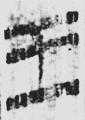王
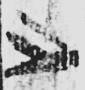之
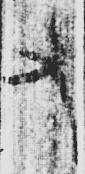又（有）
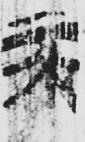天
